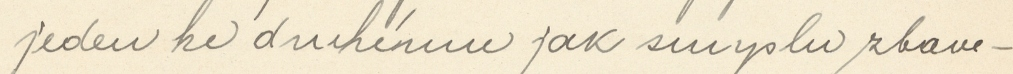jeden ke druhému jak smyslu zbave-
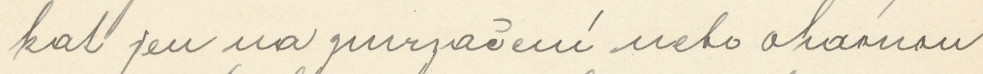kat jen na zmrzačení nebo ohavnou
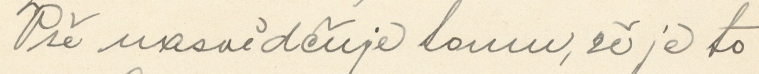Vše nasvědčuje tomu, že je to
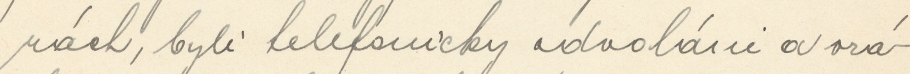rách, byli telefonicky odvoláni a vrá-
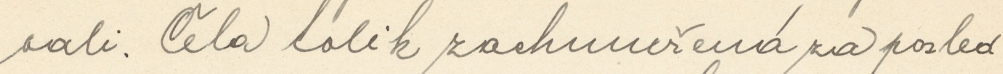vali. Čela tolik zachmuřená za posled-
